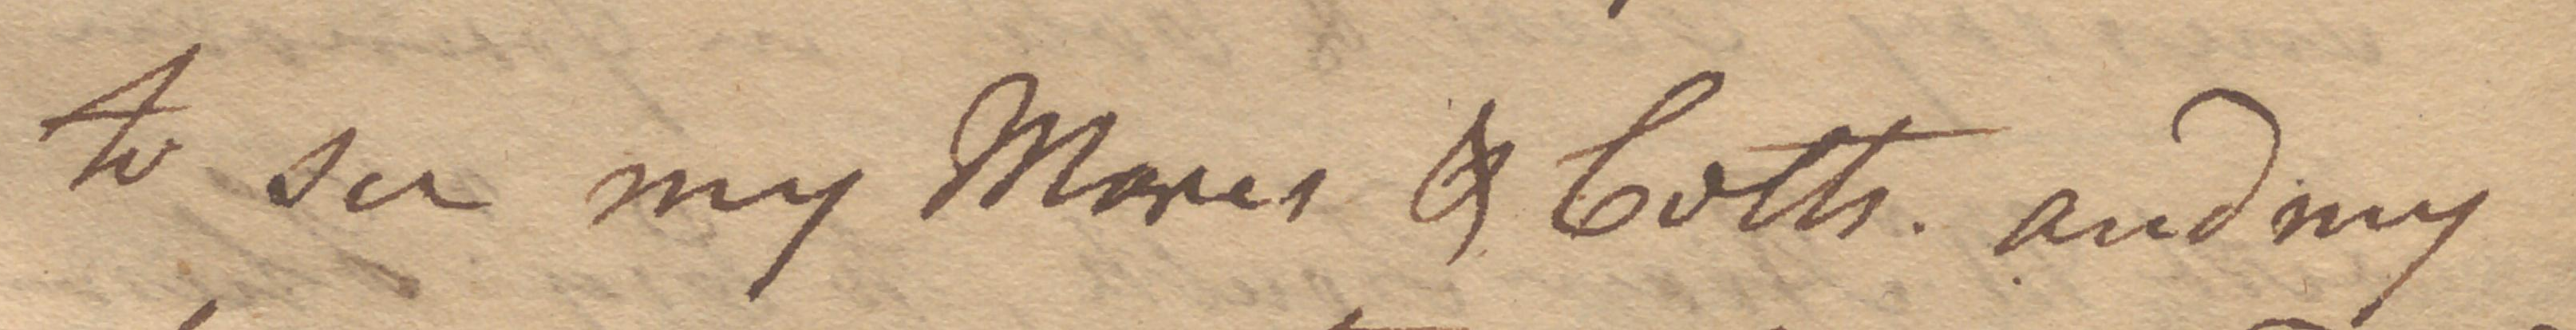to see my Mares & Colts and my
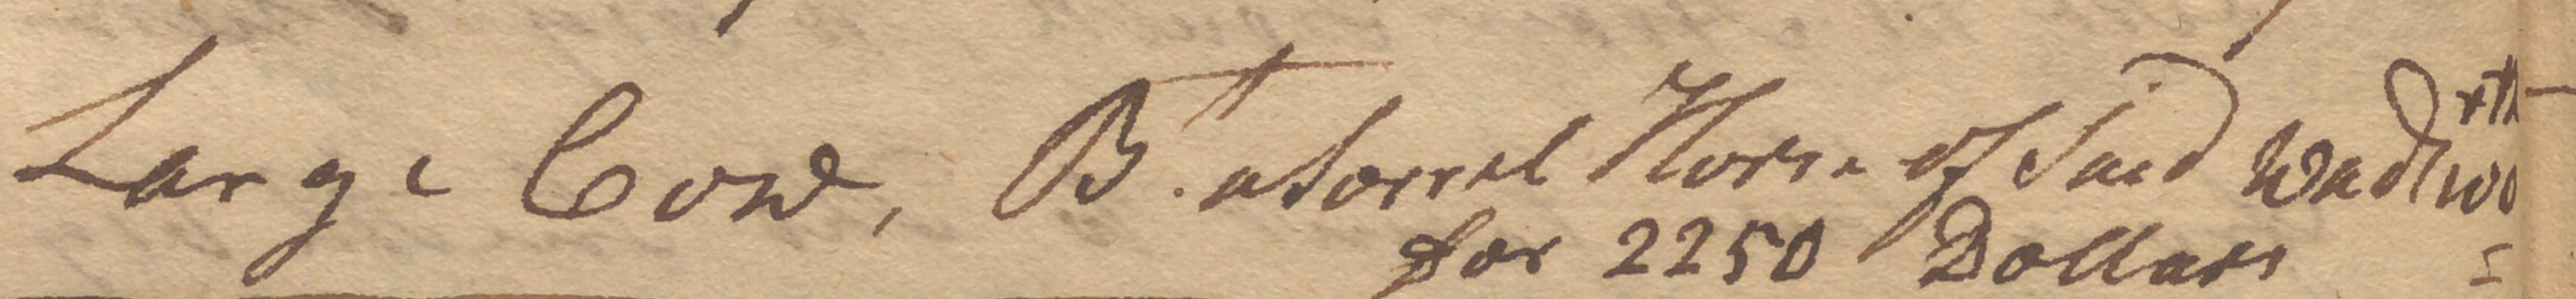Large Cow, B^t a sorrel Horse of Said Wadwo^rth
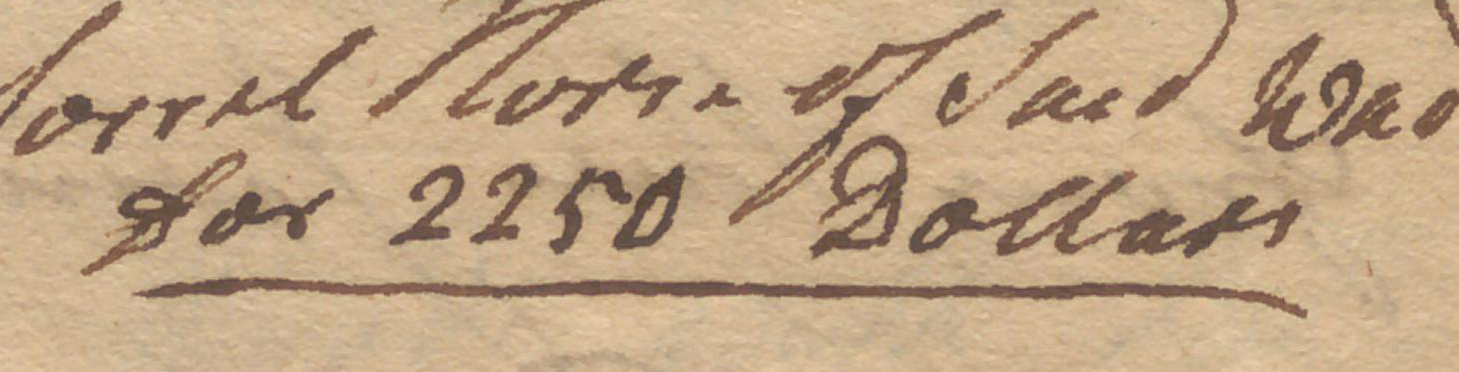for 2250 Dollars
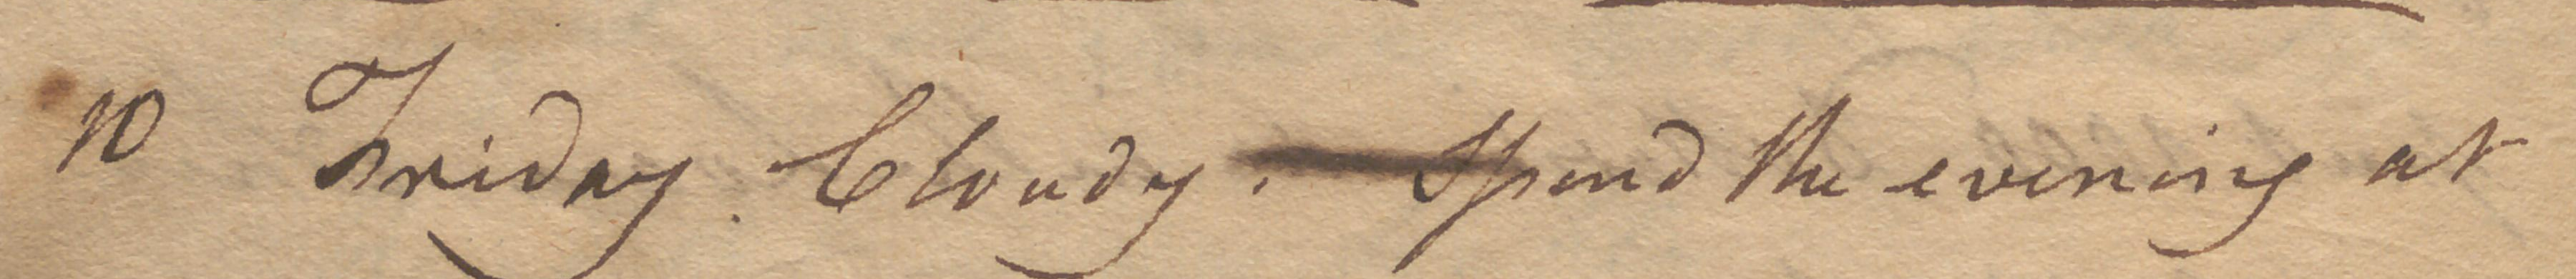10 Friday Cloudy. spend the evening at
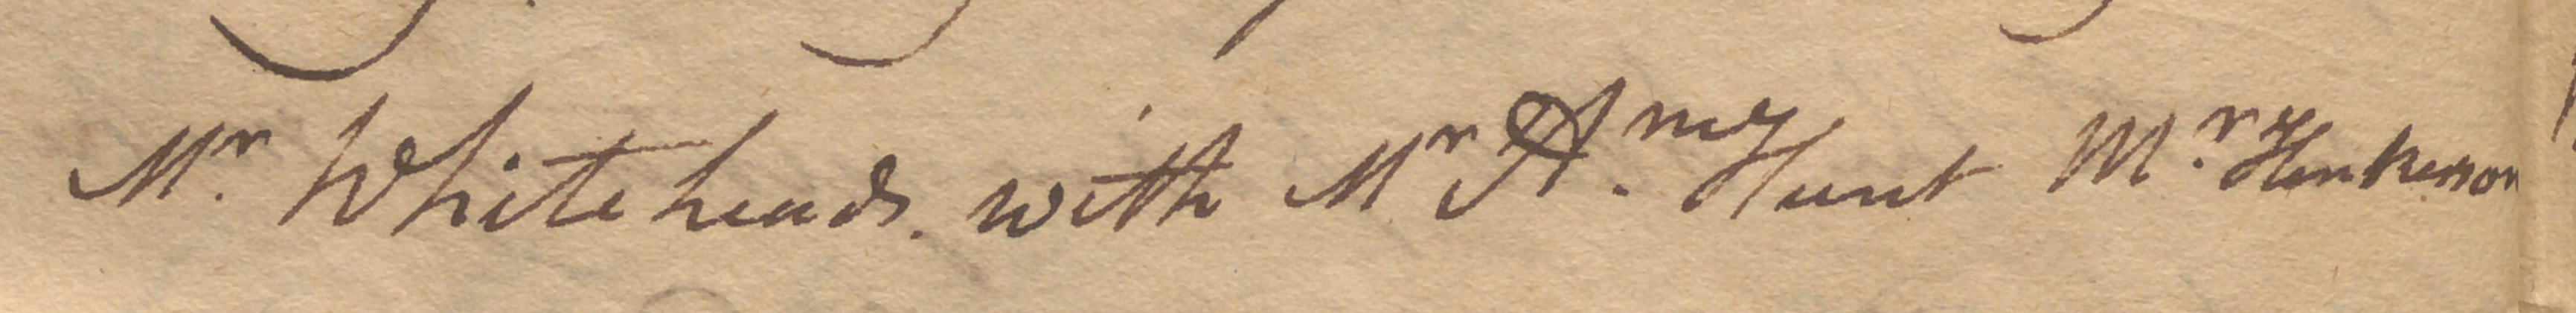M^r. Whiteheads with M^r A^m. Hunt M^r. Henkeson
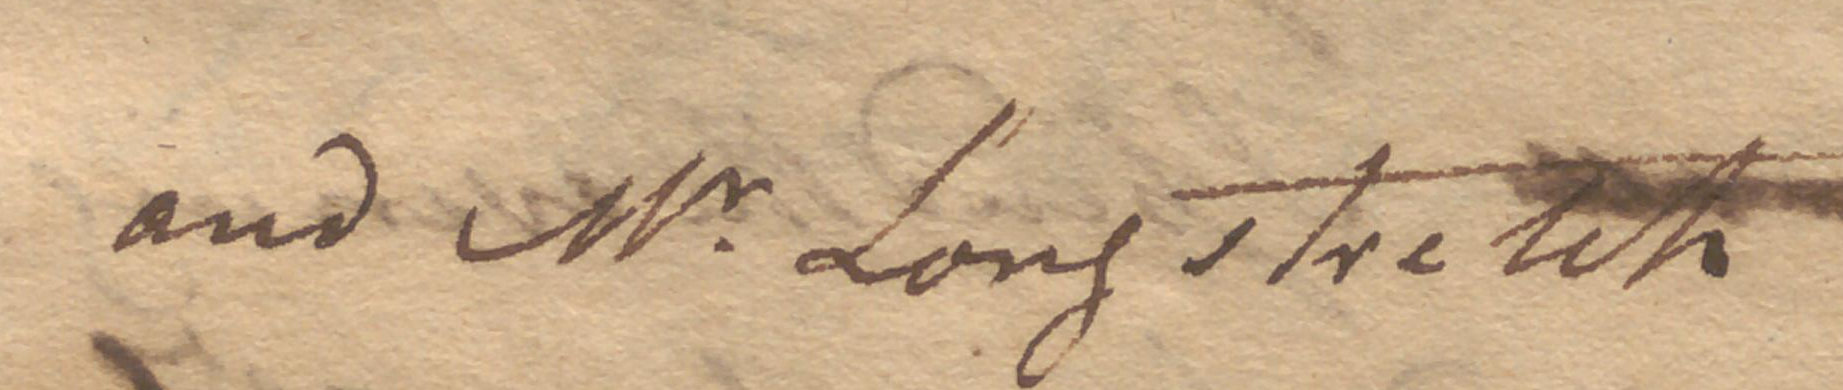and M^r. Longstretch
